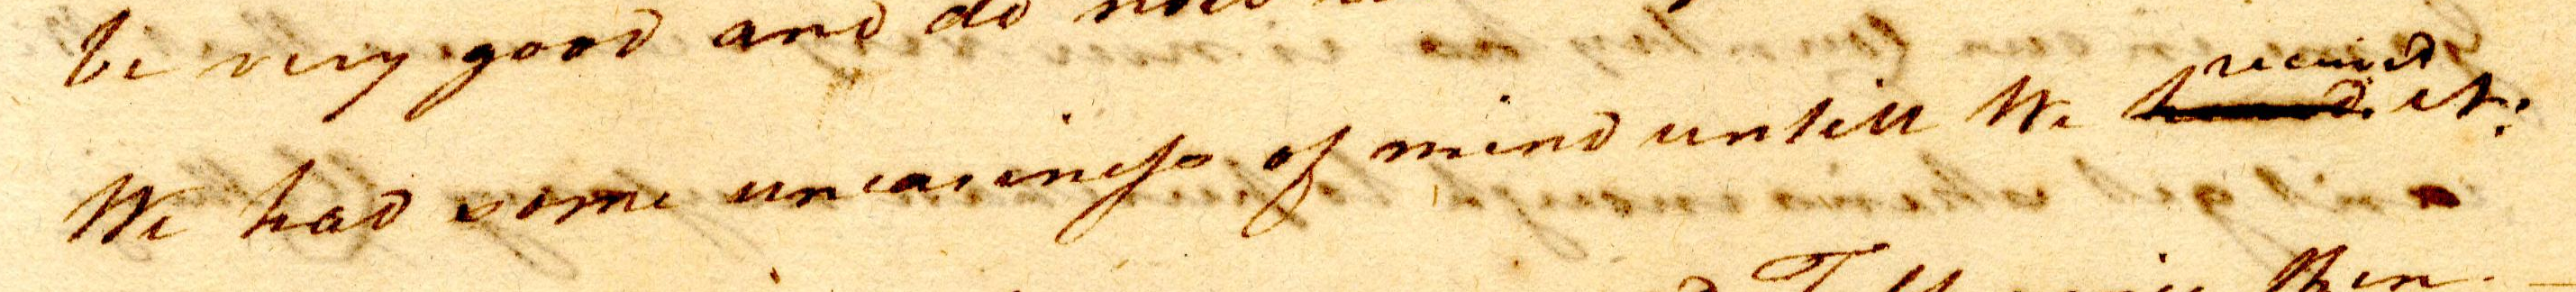We had some uneasiness of mind untill We heard it:
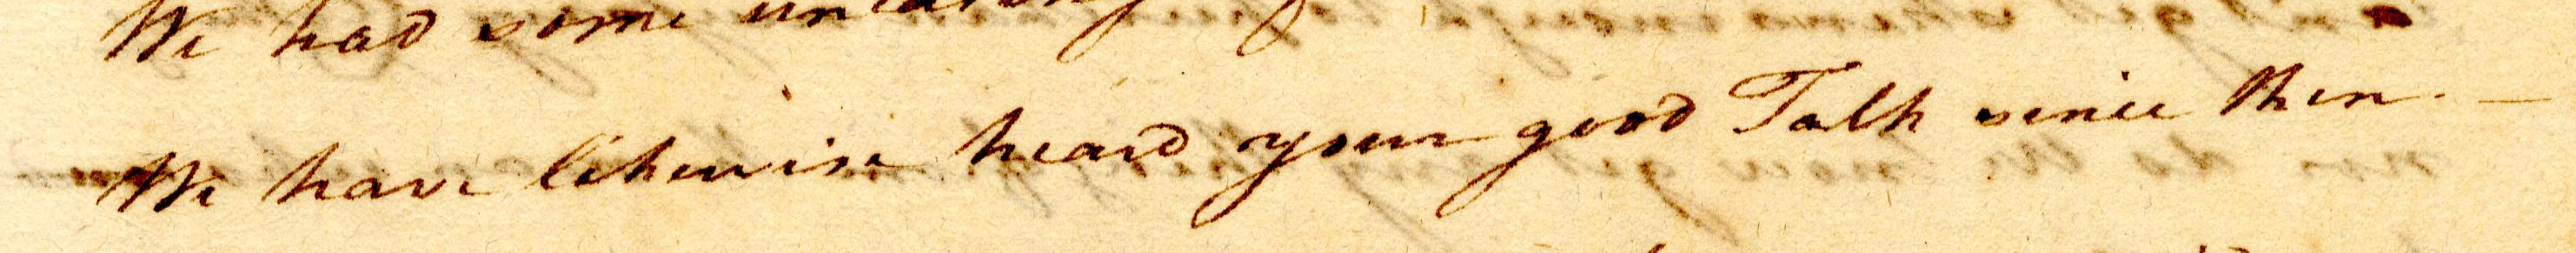We have likewise heard your good Talk since then.-
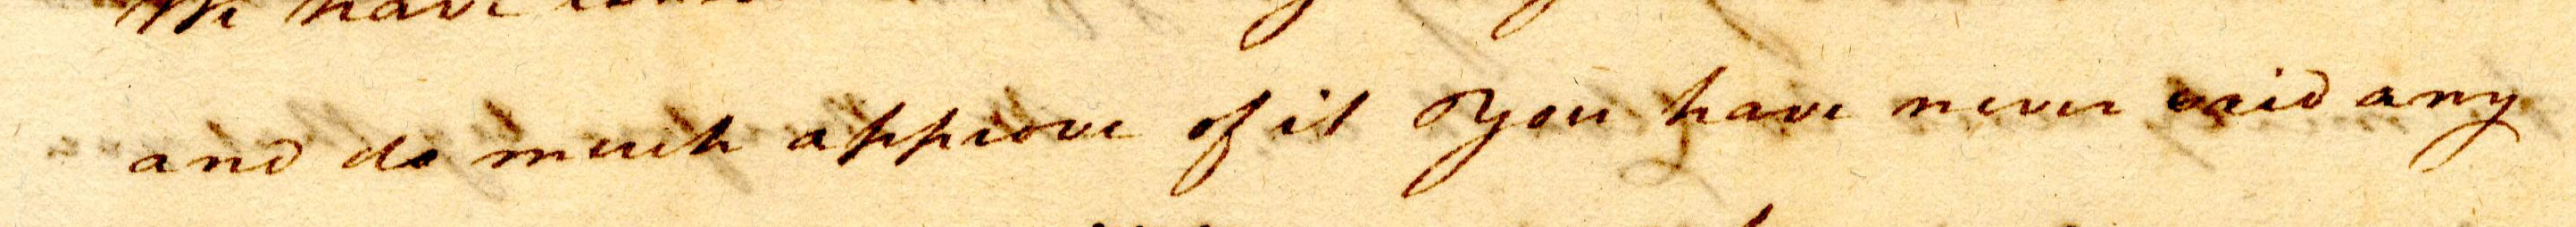and do much approve of it you have never said any
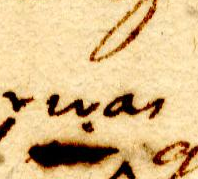was
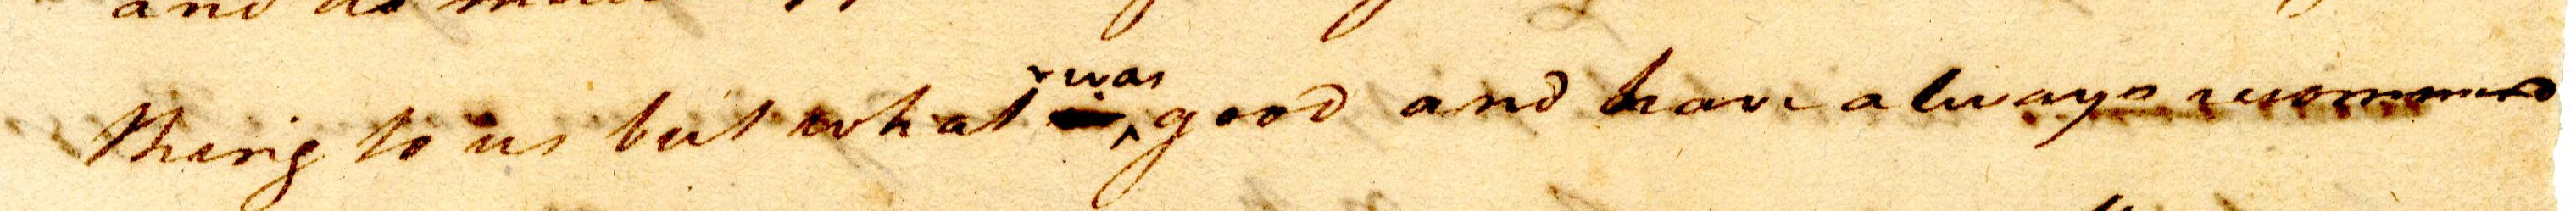thing to us but what ^ good and have always recommend-
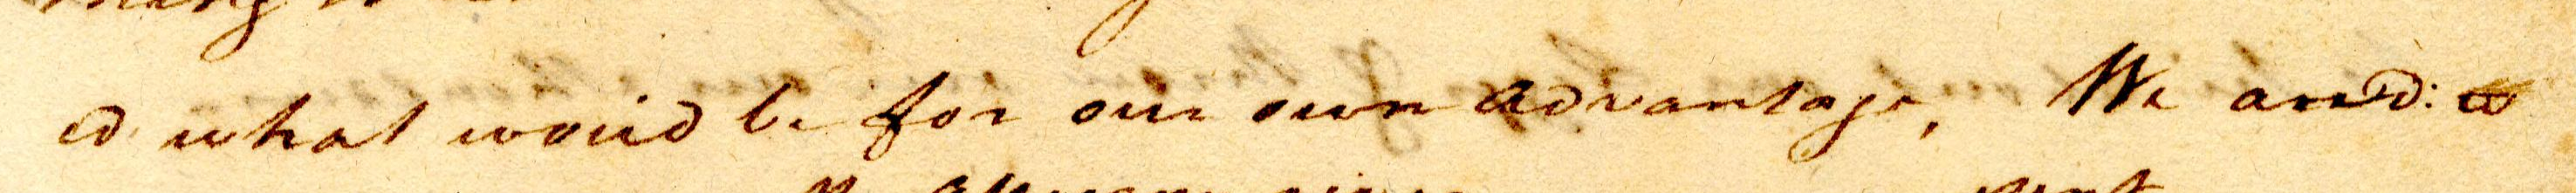ed what wou'd be for our own advantage. We arrd: to
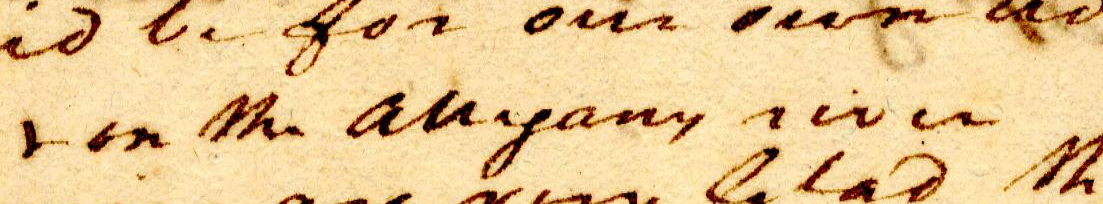on the Allegany river
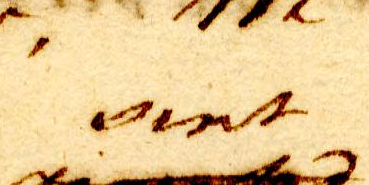sent
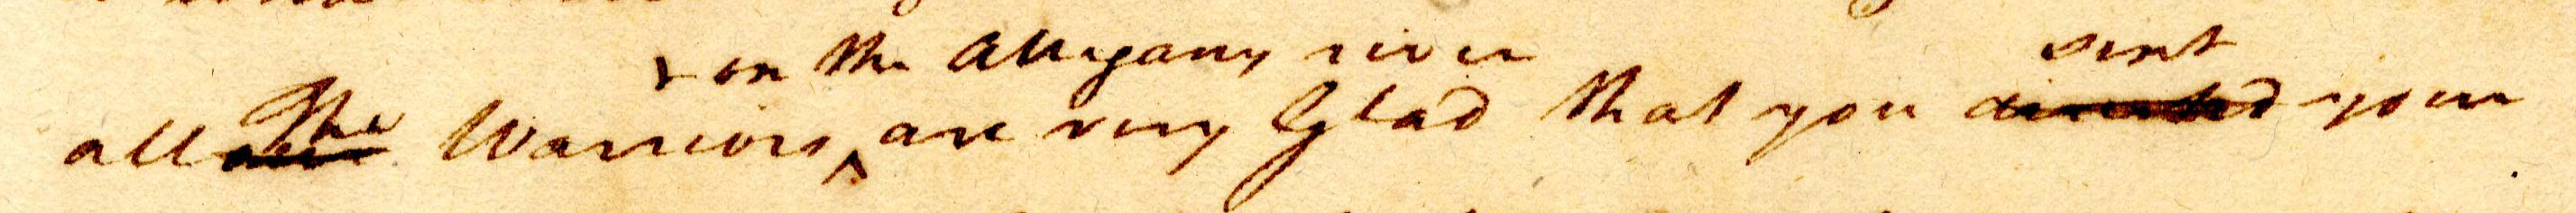all the Warriors ^ are very Glad that you ^delivered your
